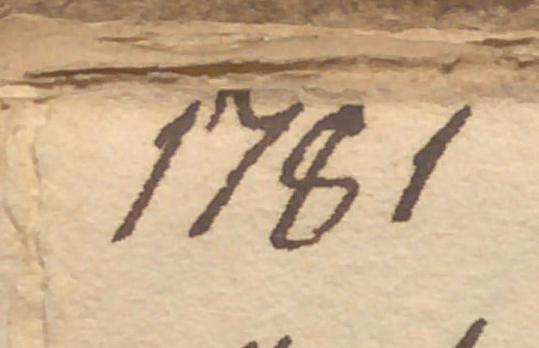1781
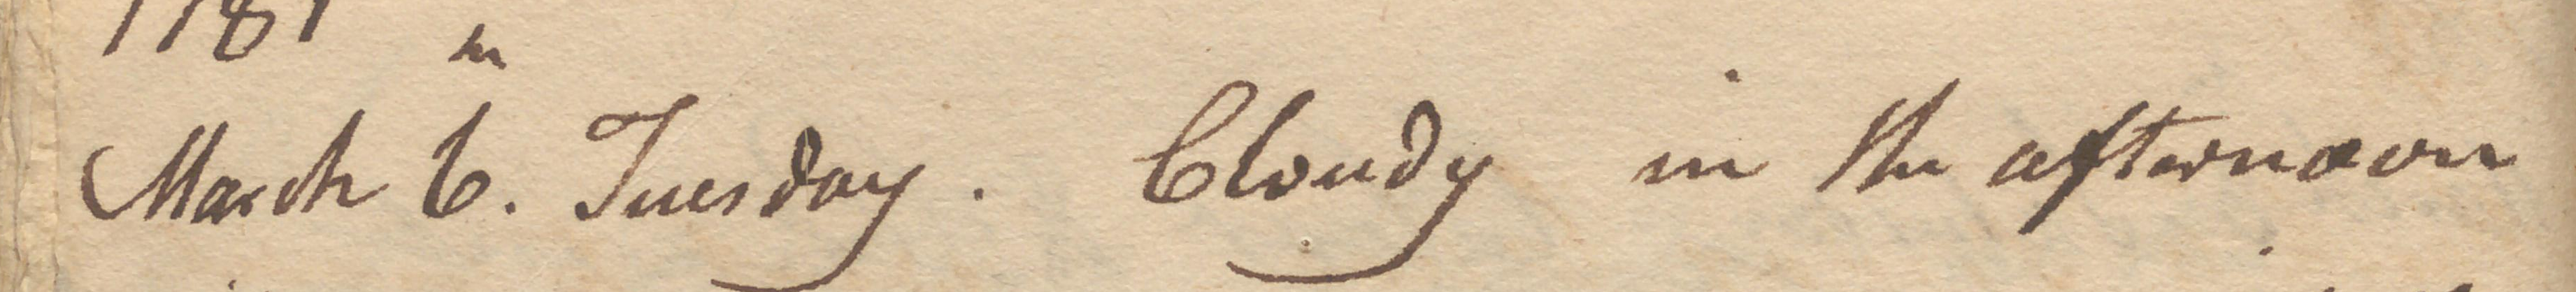March 6^th. Tuesday. Cloudy in the afternoon
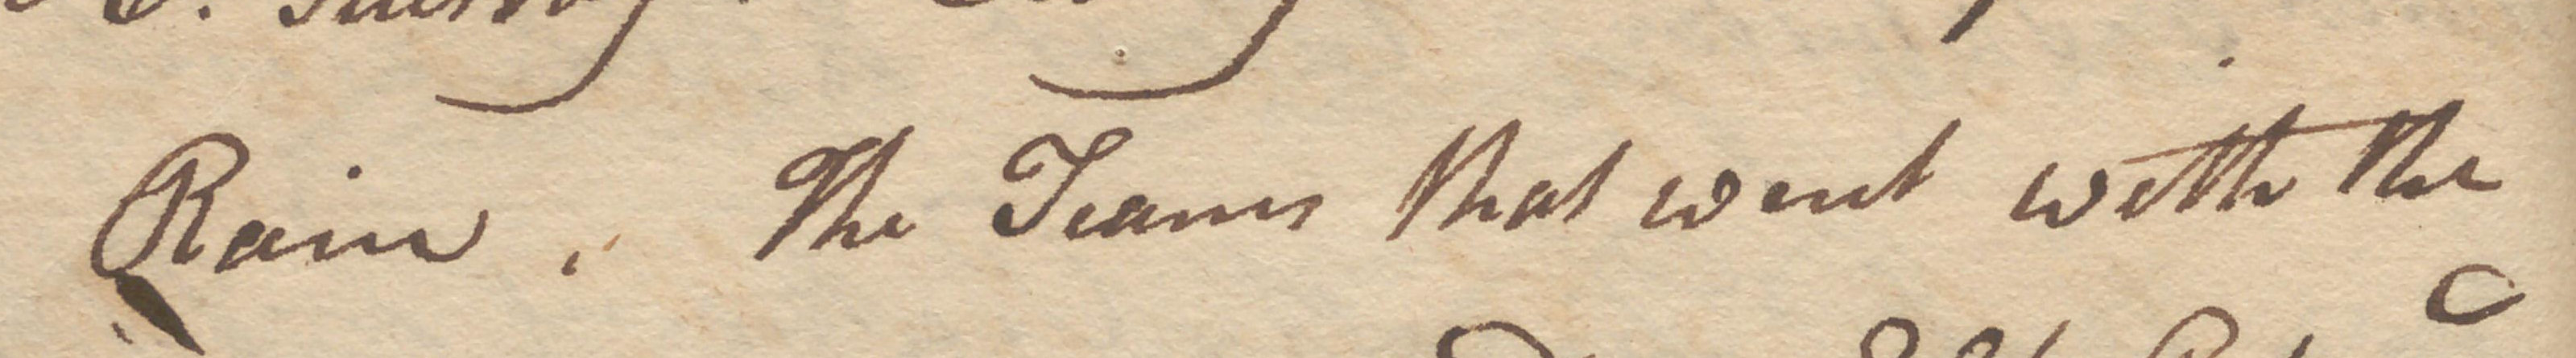Rain. The Teams that went with the
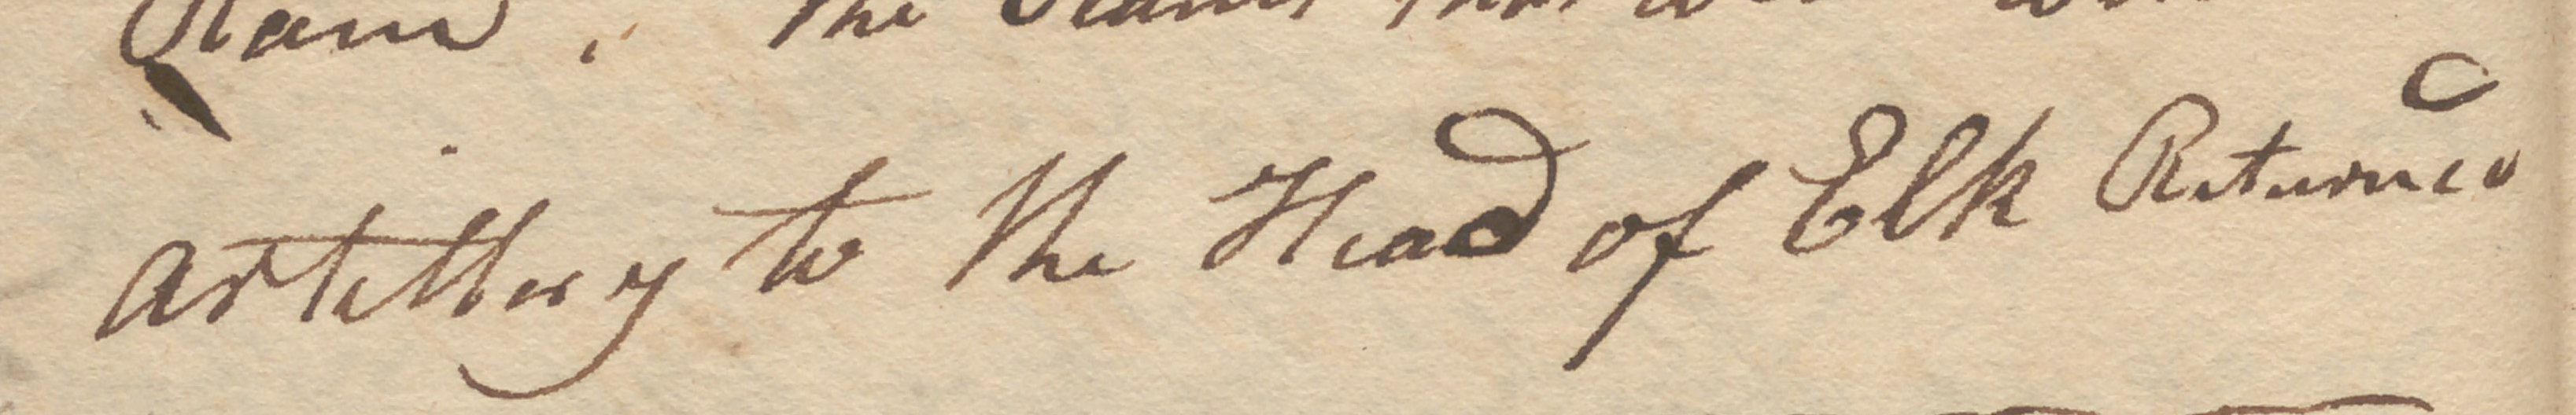Artillery to the Head of Elk Returned
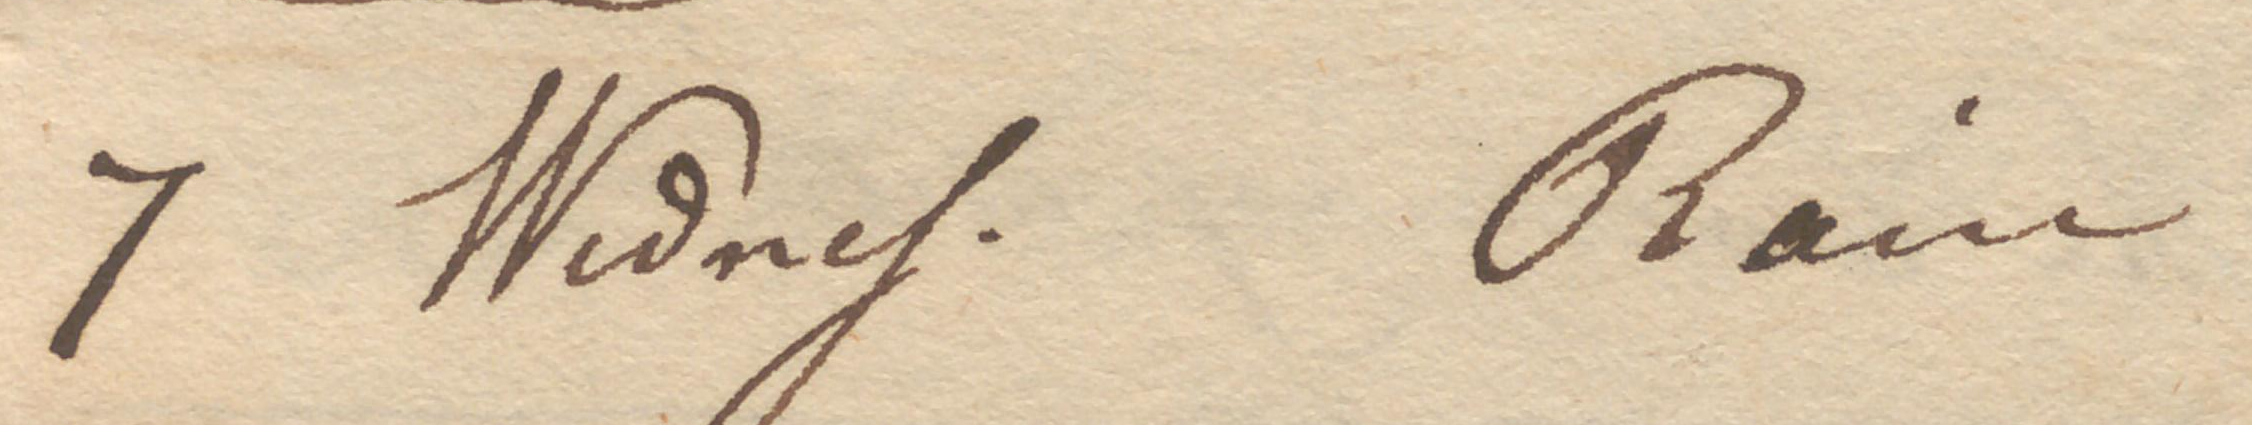7 Wednes. Rain
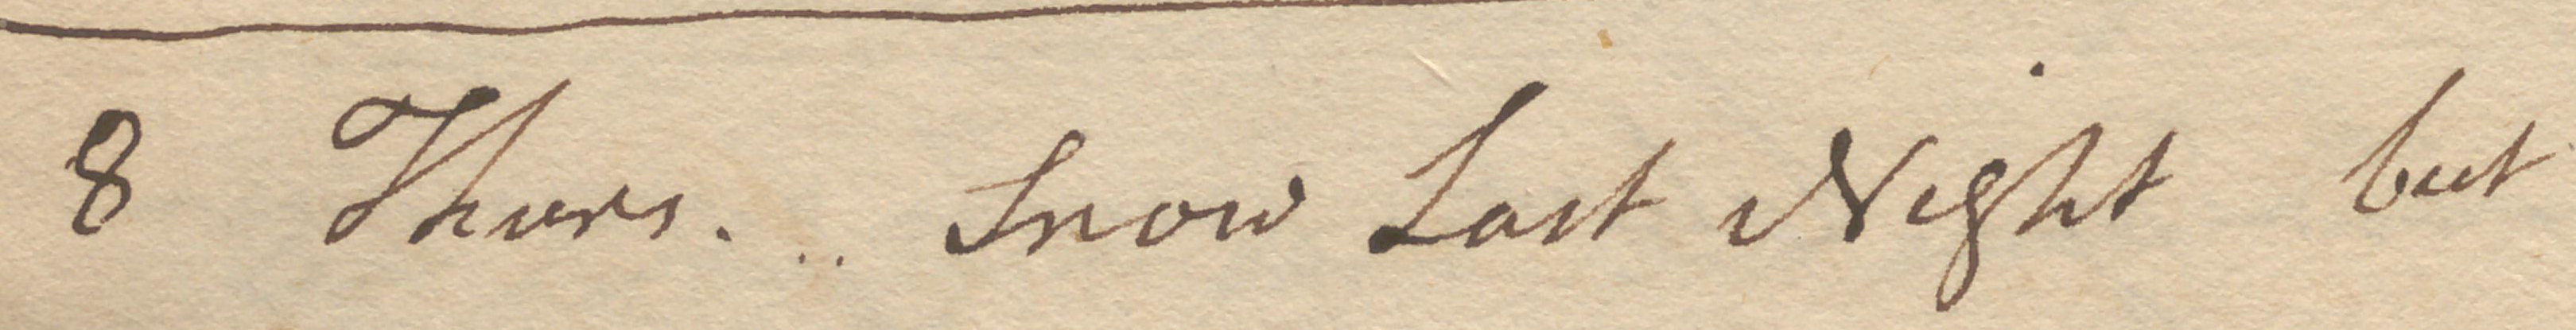8 Thurs. Snow Last Night but
